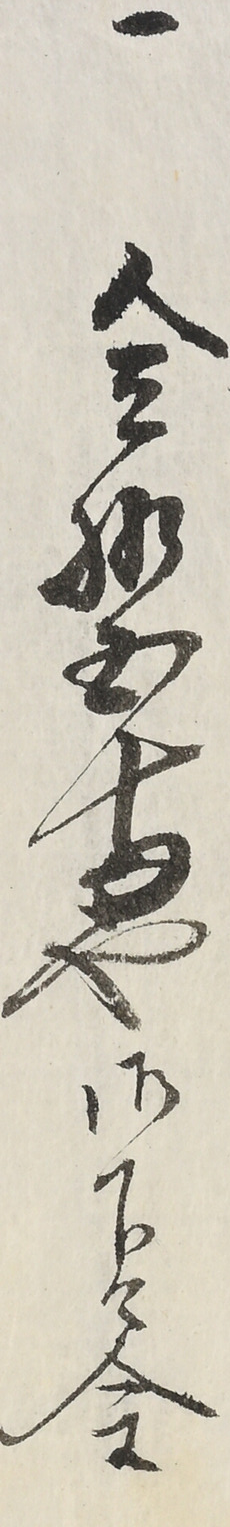一金拾五両也御下ヶ金
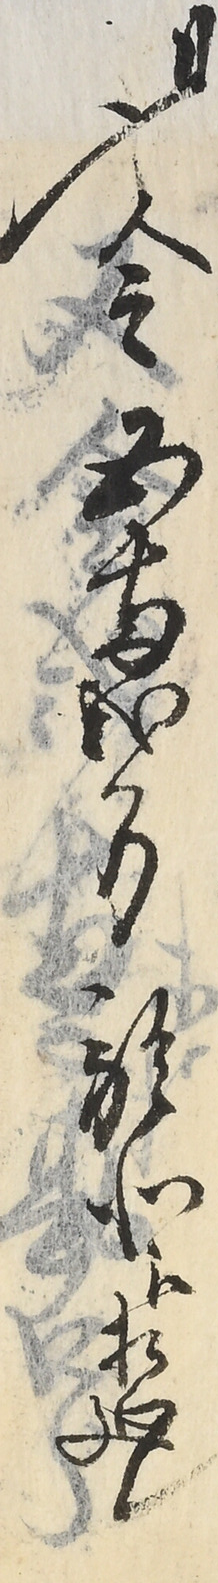〆金五両弐分於北江相迫候
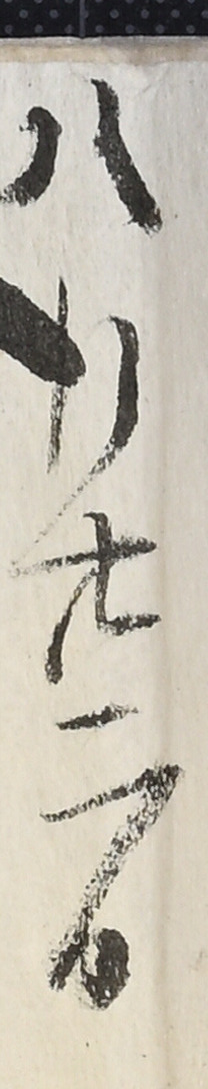八月廿二日
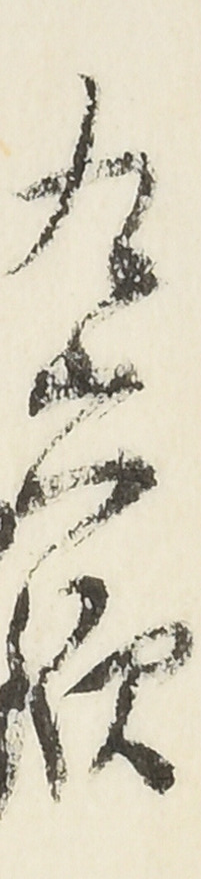九六鍬
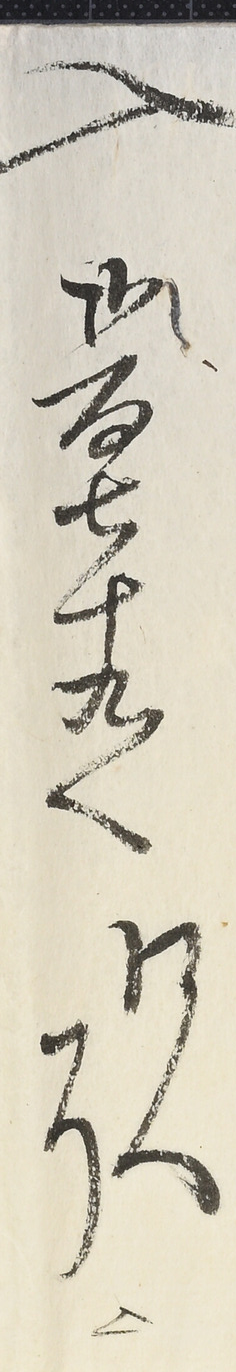入弐百七十九文同人△
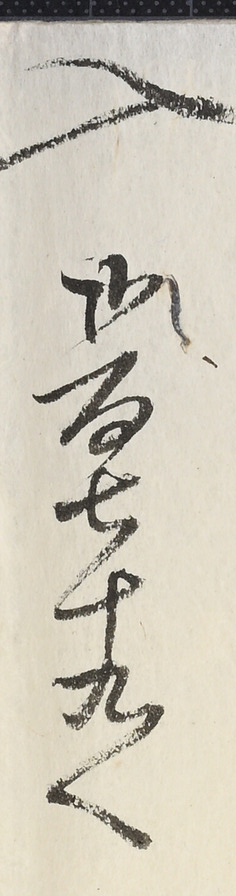弐百七十九文
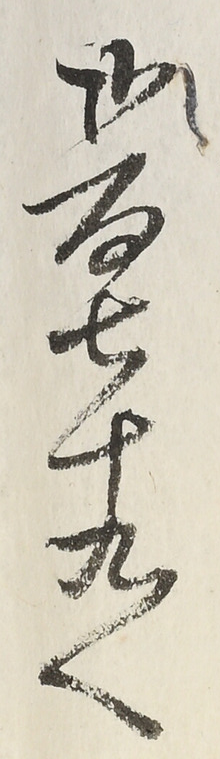弐百七十九文
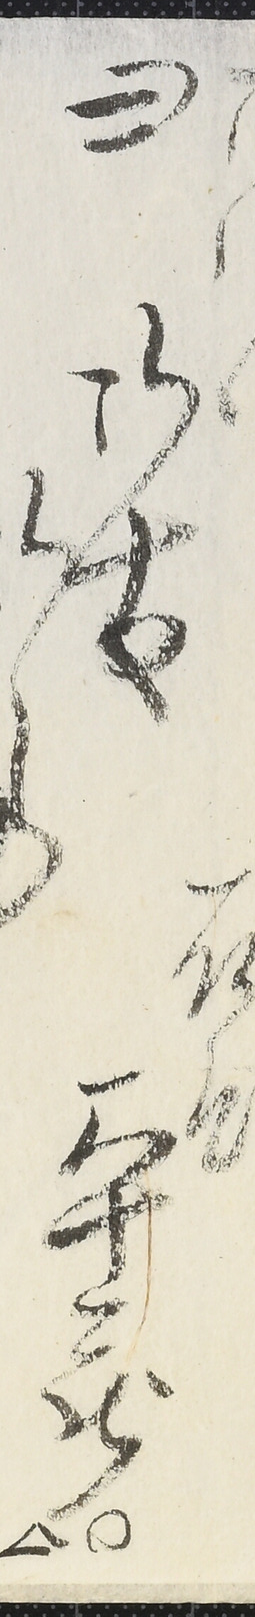八月廿二日
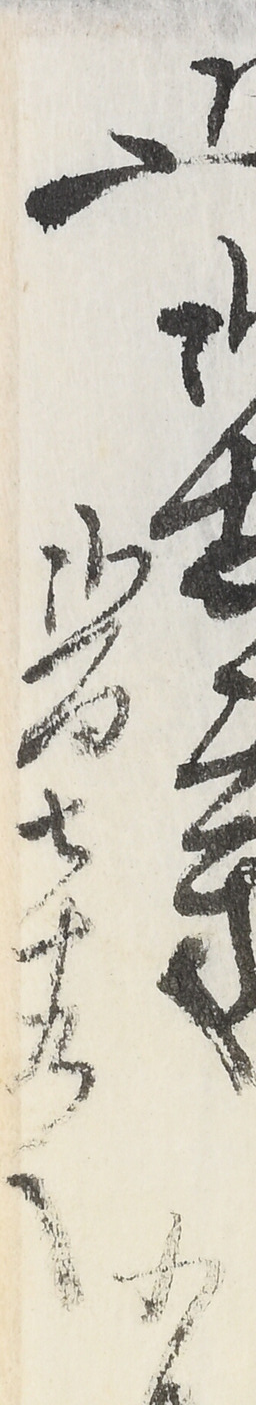弐百七十九文
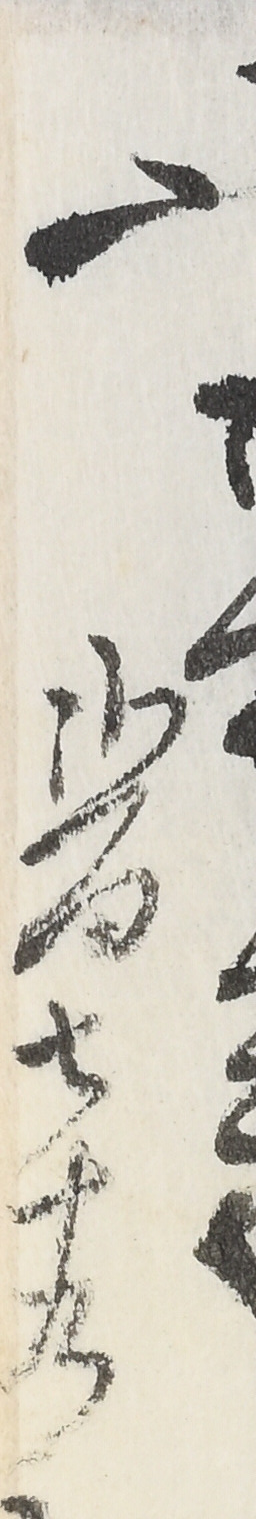弐百七十九文
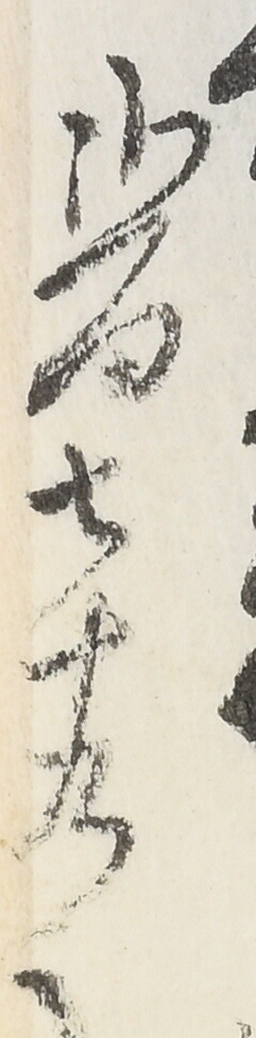弐百七十九文
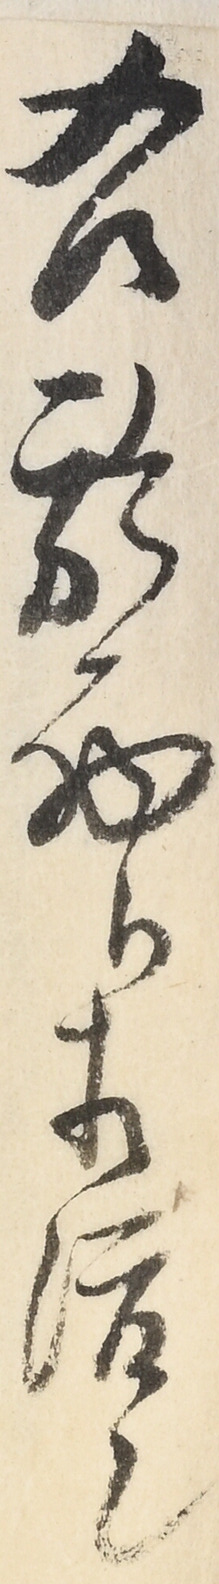右於西江相渡シ
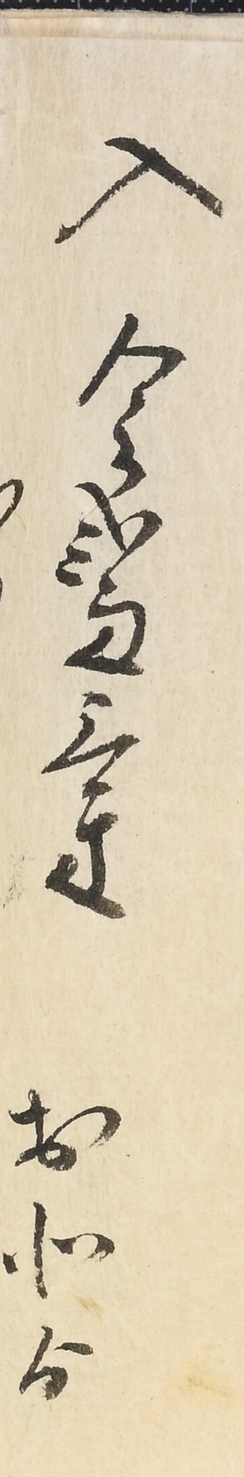入金弐両三朱於北ゟ
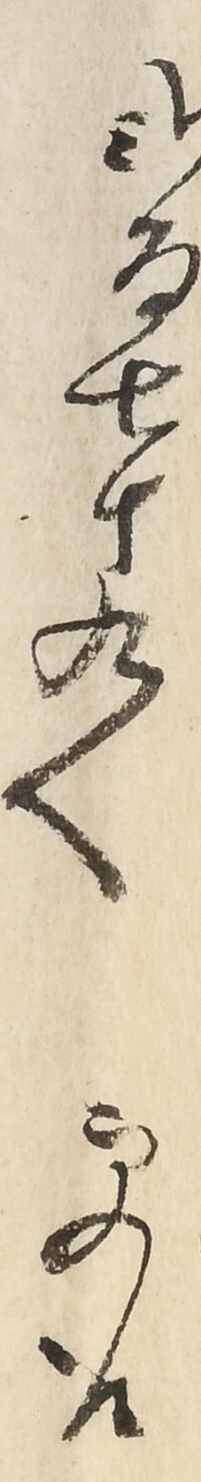弐百七十九文受取
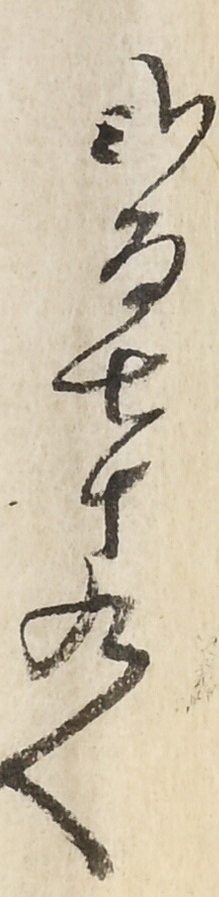弐百七十九文

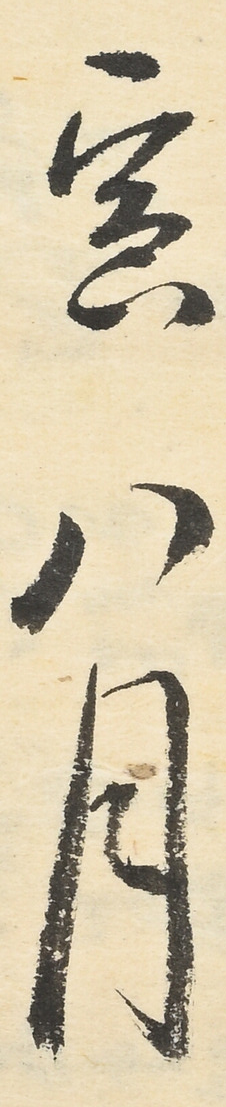寅八月
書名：町方木戸御普請諸事附（一括）
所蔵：伊那市立高遠町図書館・合同会社AMANE
